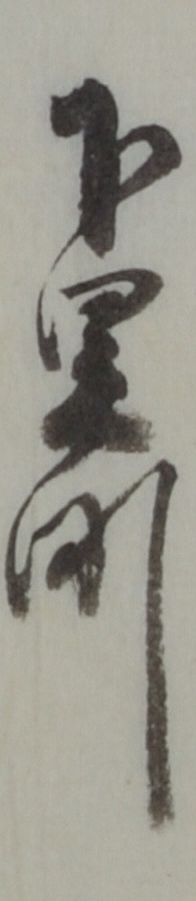下里町
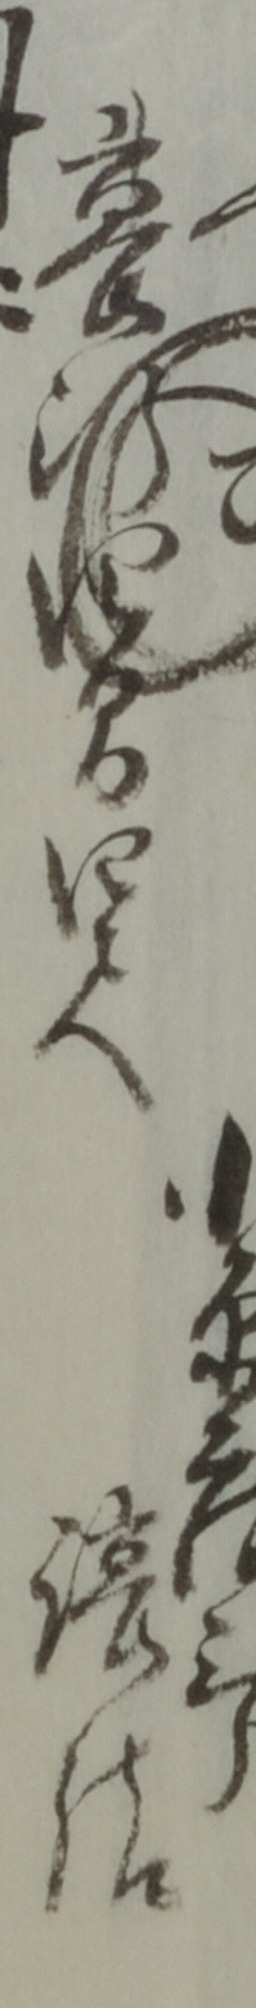裏行四間四尺譲請
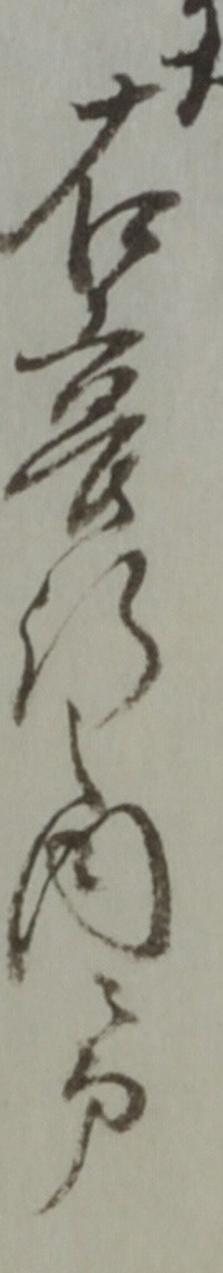右裏行之内ニ而
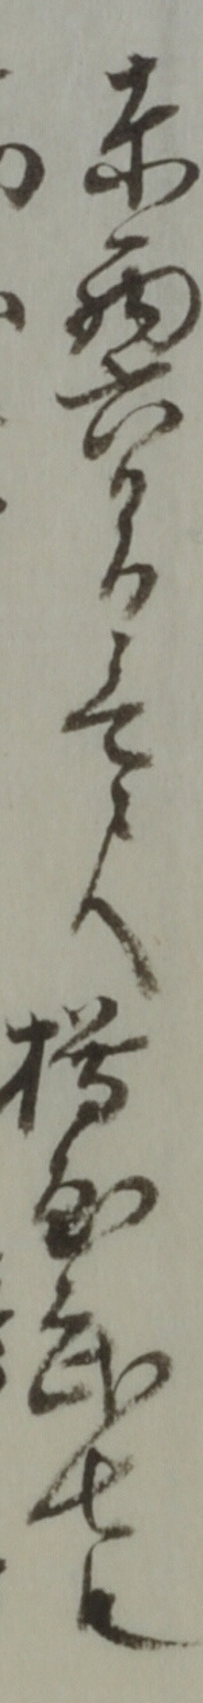東西六間壱尺樽屋武七江
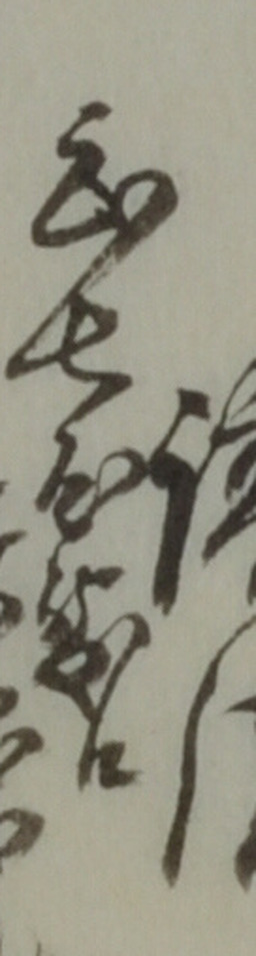武七屋敷江
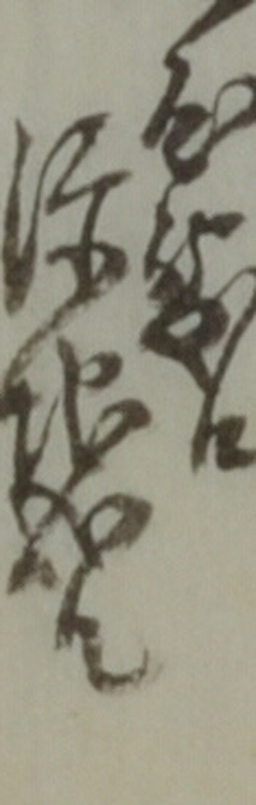添地成ル
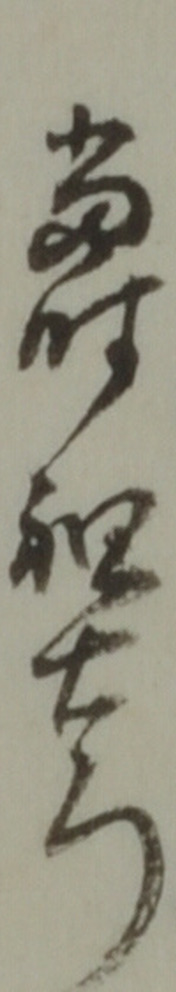当時祖右衛門
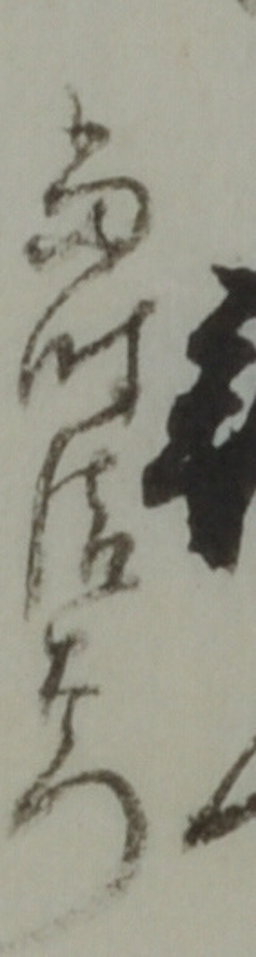当時清右衛門
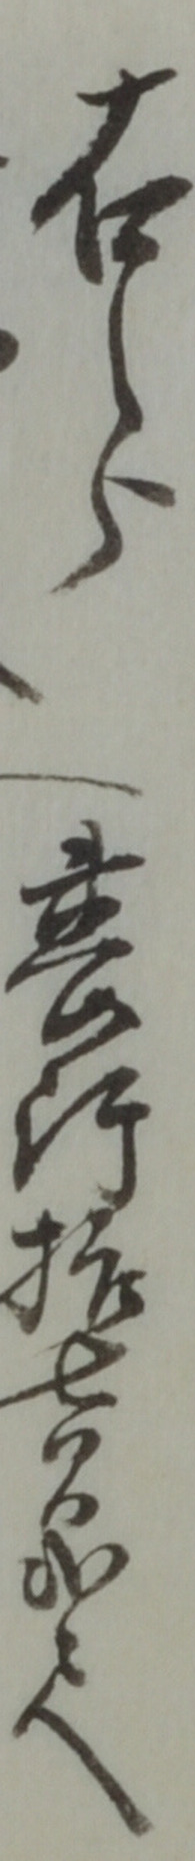右之分裏行拾七間弐尺
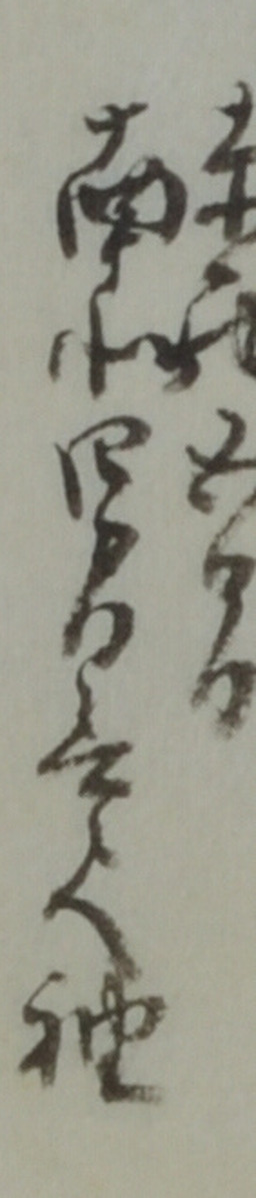南北四間壱尺袖

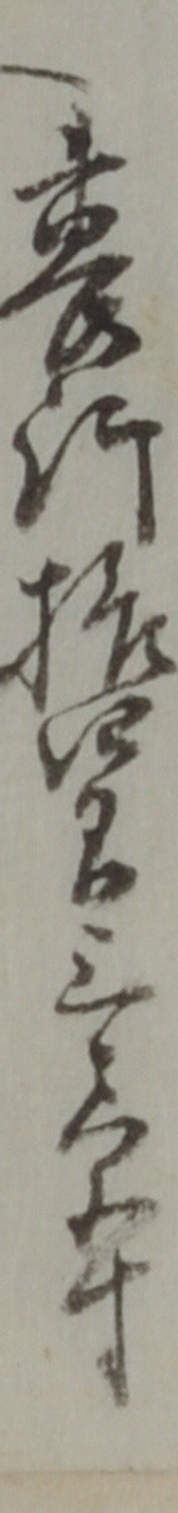裏行拾四間五尺孫八郎
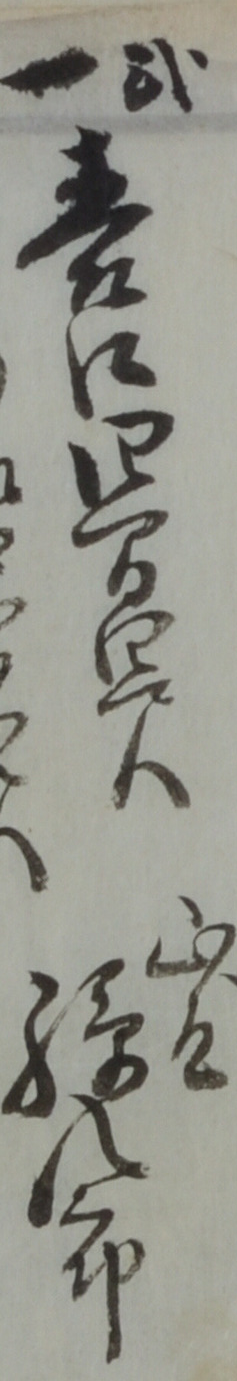一表口四間四尺山屋
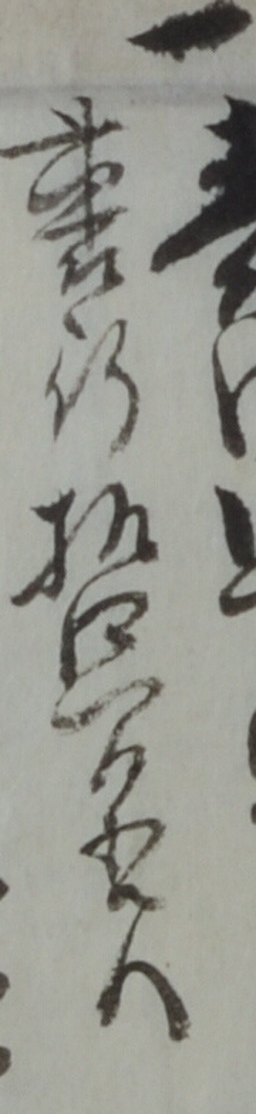裏行拾四間五尺孫八郎
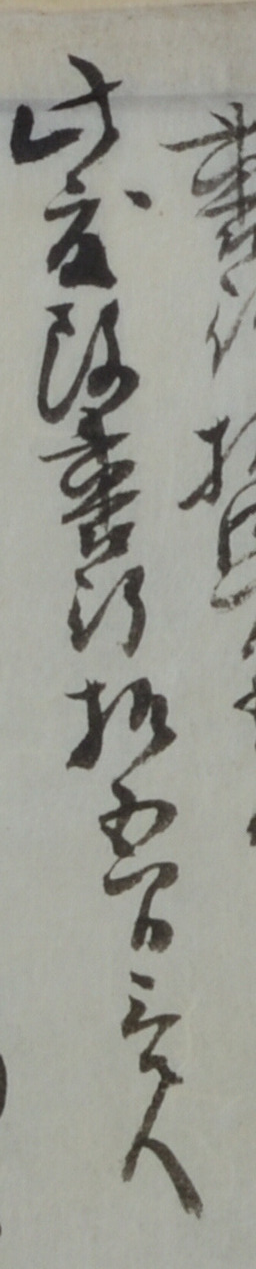此度改裏行拾五間三尺
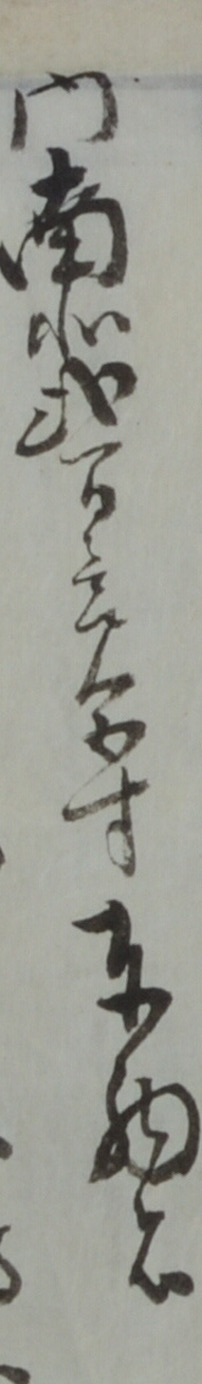内南北弐間壱尺五寸東西者
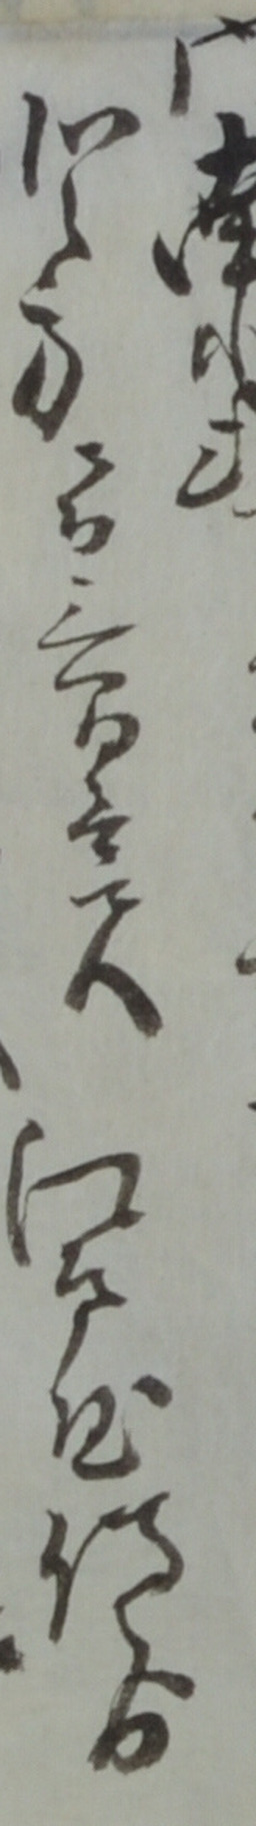北之方ニ而三間壱尺江戸屋伝右衛門
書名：屋敷表口裏行書上
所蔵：伊那市立高遠町図書館・合同会社AMANE
